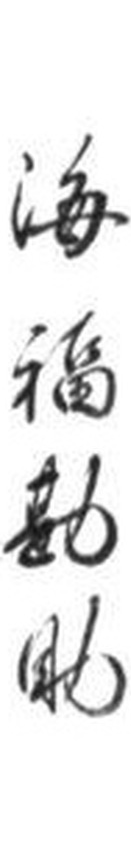海福勘助
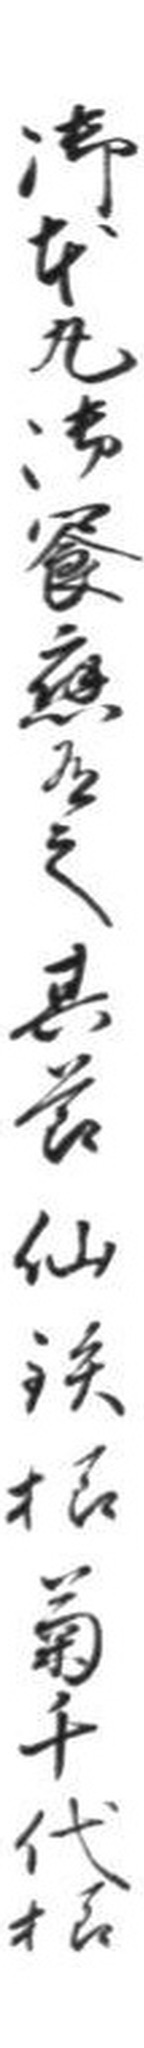御本丸御饗応有之其節仙鉃様菊千代様
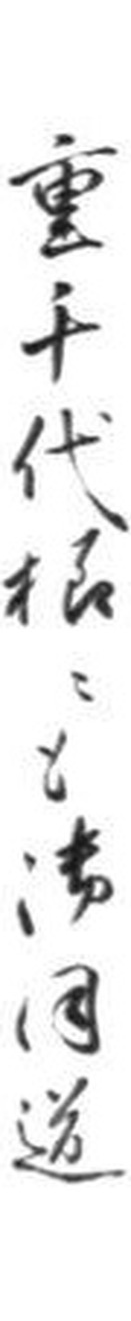重千代様にも御同道
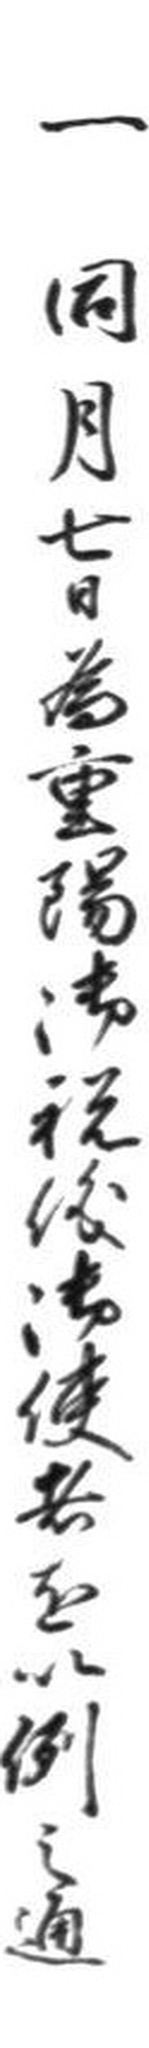一同月七日為重陽御祝儀御使者を以例之通
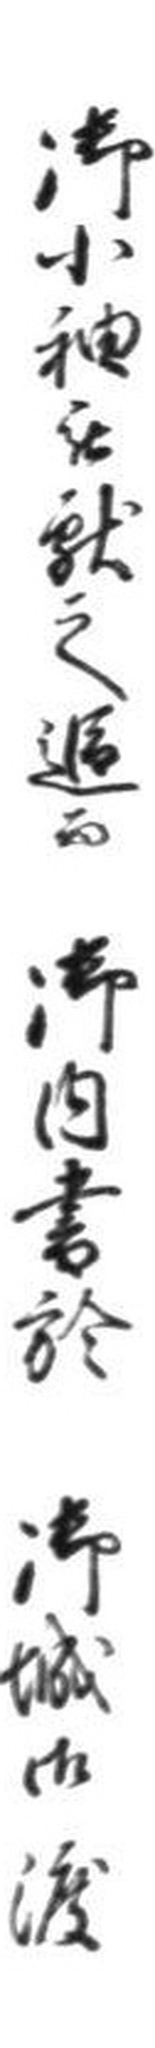御小袖被献之追而御内書於御城御渡
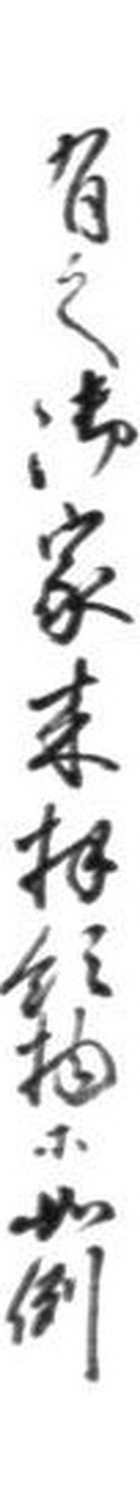有之御家来拝領物等如例
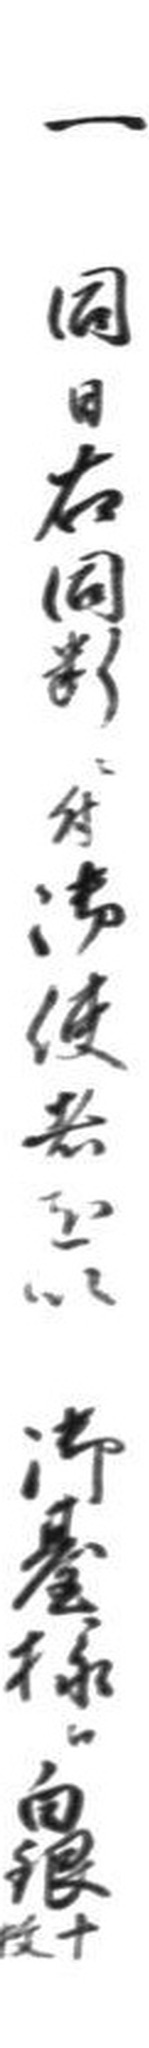一同日右同断に付御使者を以御台様え白銀十枚
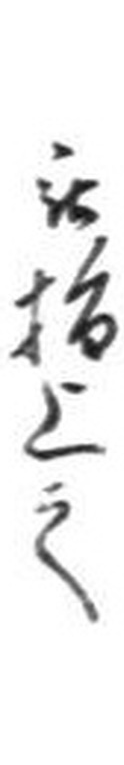被指上之
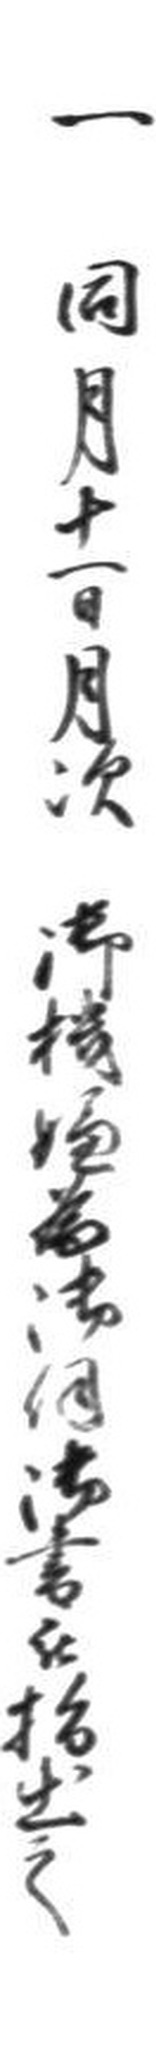一同月十一日月次御機嫌為御伺御書被指出之
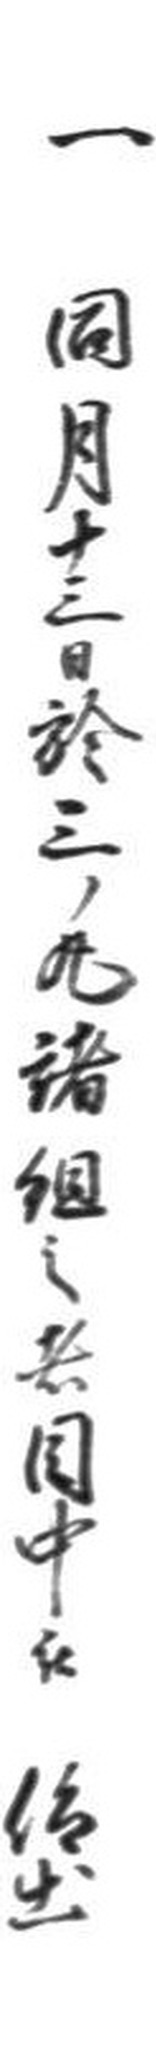一同月十三日於三ノ丸諸組之者同中被仰出
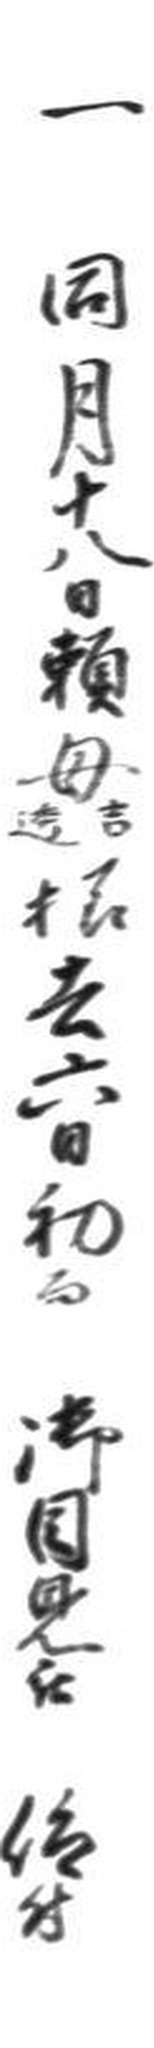一同月十八日頼母吉透様去六日初而御目見被仰付
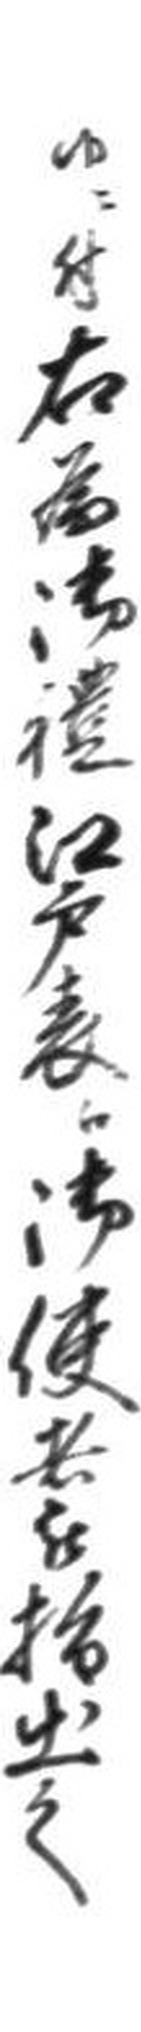候に付右為御礼江戸表え御使者被指出之

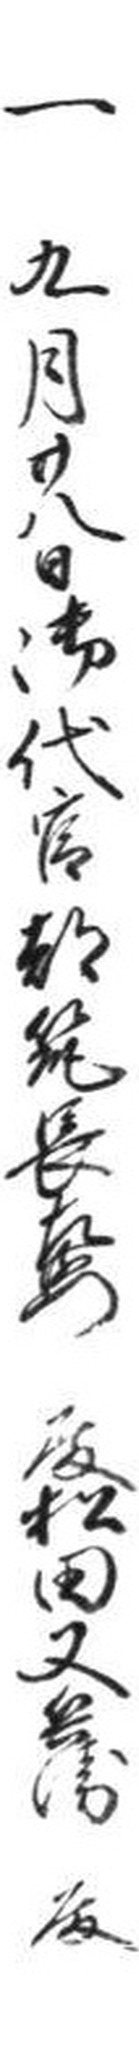一九月廿八日御代官都筑長左衛門殿松田又兵衛殿
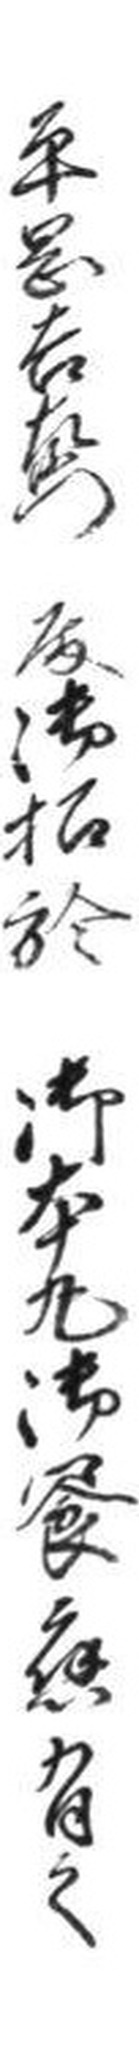平岡吉左衛門殿御招於御本丸御饗応有之
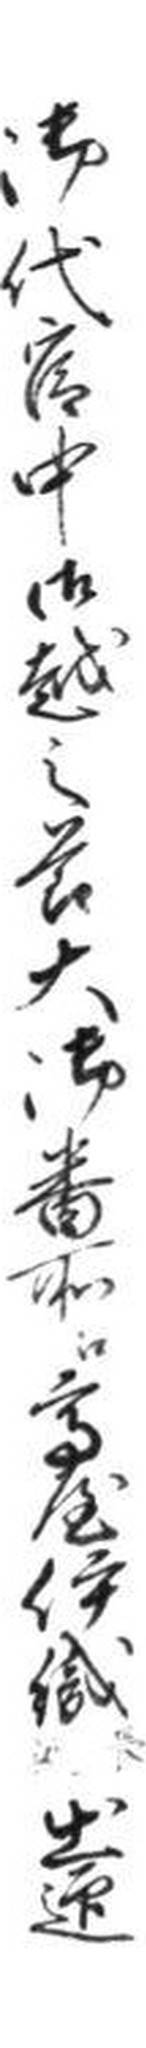御代官中御越之節大御番所え高屋伊織長英出迎
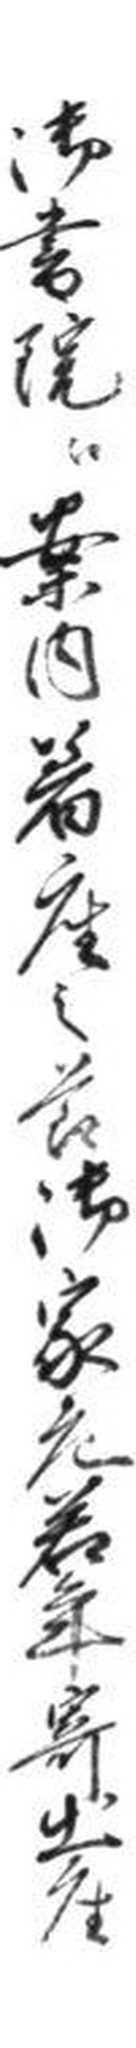御書院え案内着座之節御家老若年寄出座
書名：家譜 十六 吉品公 従貞享三年閏三月到同四年
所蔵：福井県文書館 Fukui Prefectural Archives
